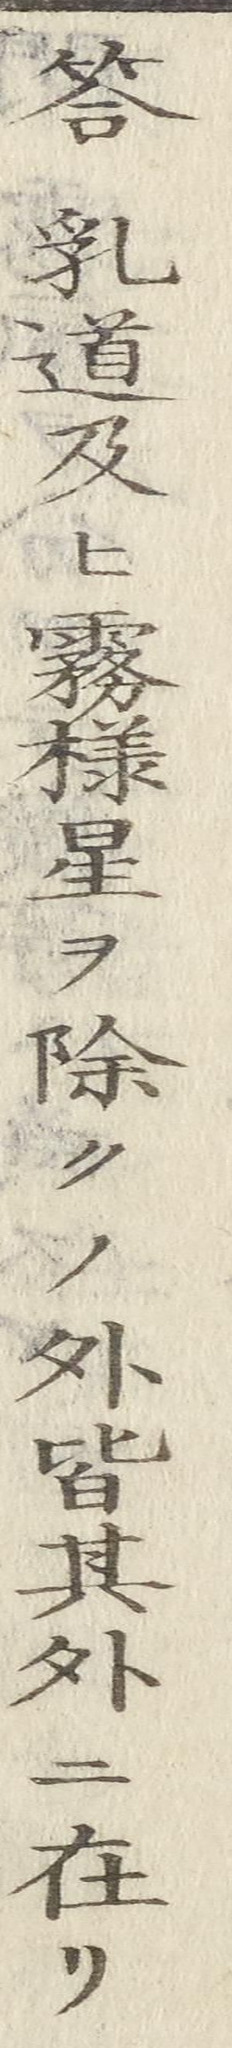問乳道及ヒ霧様星ヲ除クノ外皆其外ニ在リ
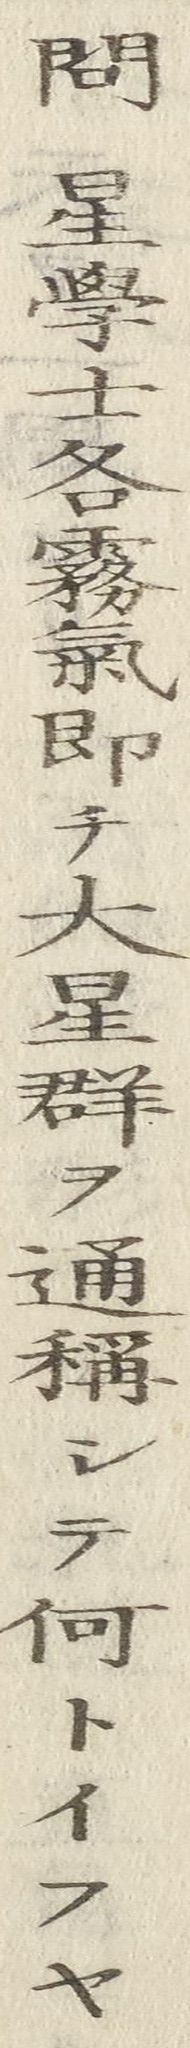問星学士各霧気即チ大星群ヲ通称シテ何トイフヤ
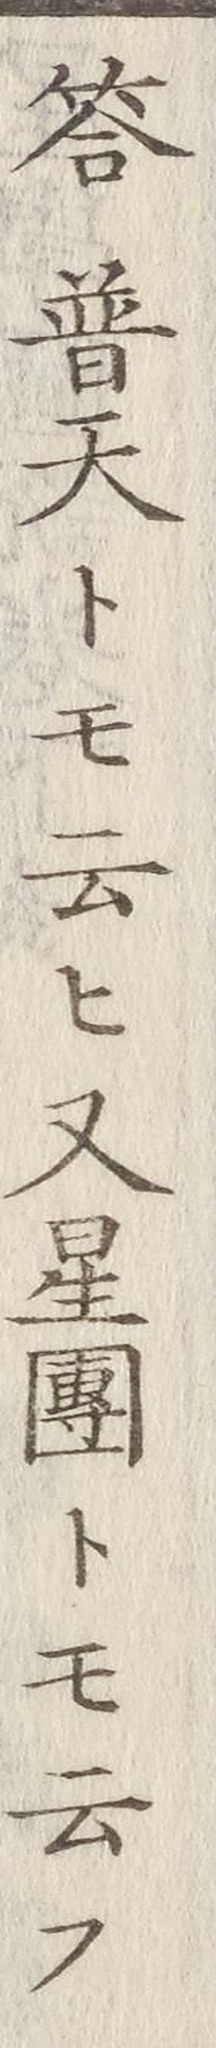答普天トモ云ヒ又星団トモ云フ
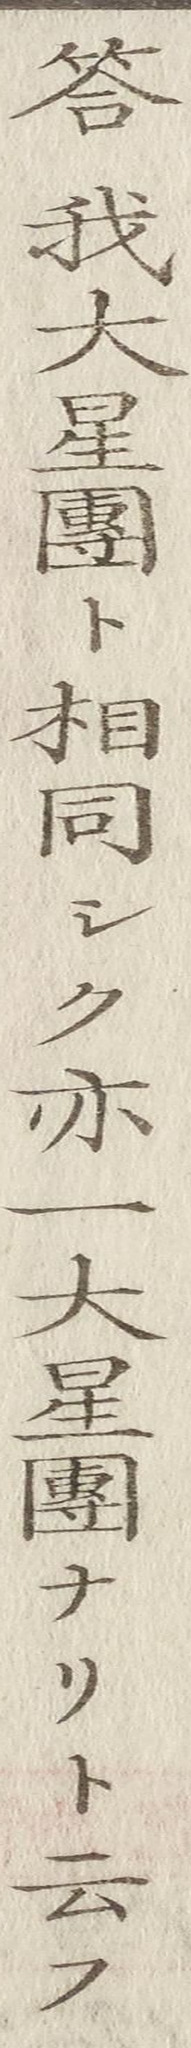答我大星団ト相同シク亦一大星団ナリト云フ
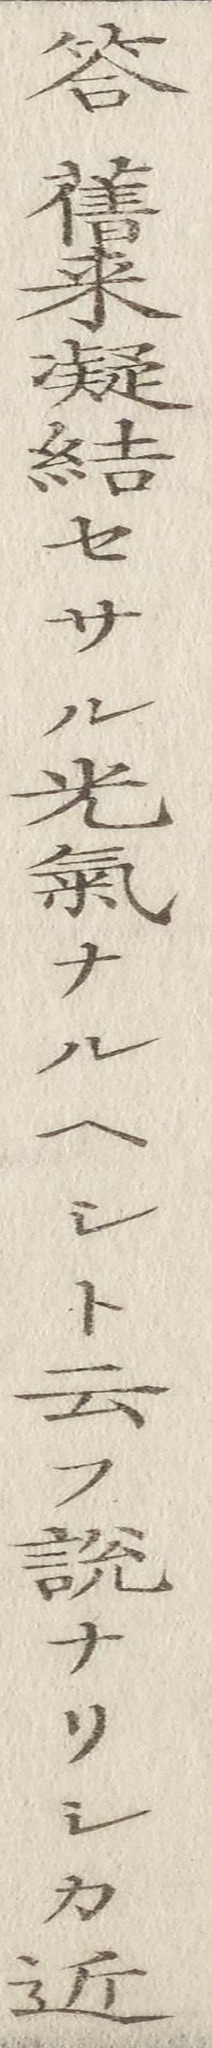答旧来凝結セラル光気ナルヘシト云フ説ナリシカ近
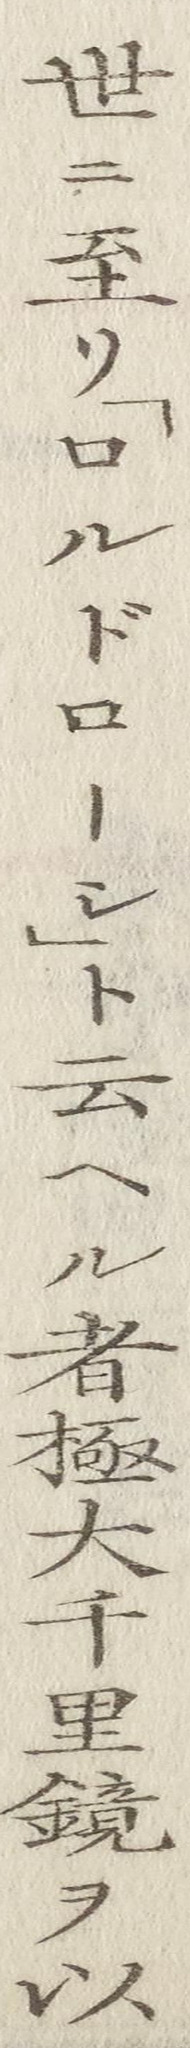世ニ至リ「ロルドローシ」ト云ヘル者極大千里鏡ヲ以
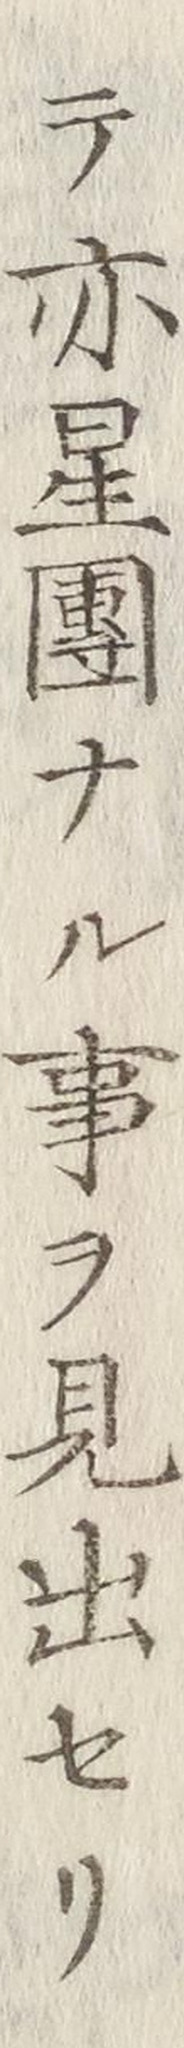テ亦星団ナル事ヲ見出セリ
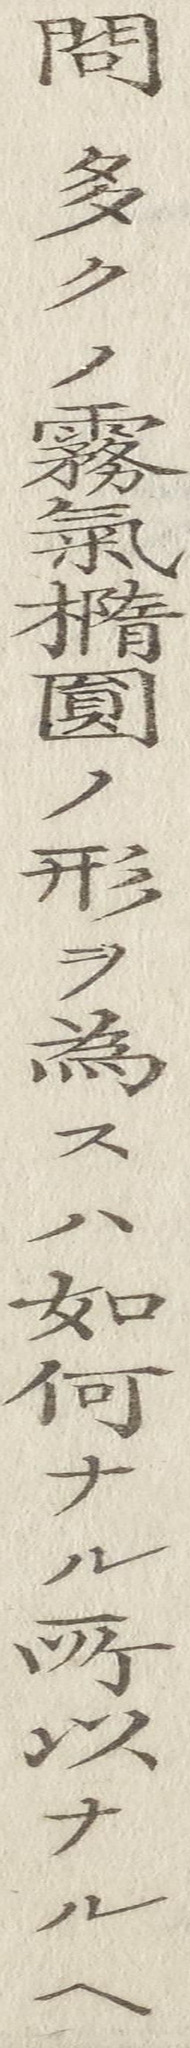問多クノ霧気楕円ノ形ヲ為スハ如何ナル所以ナルヘ
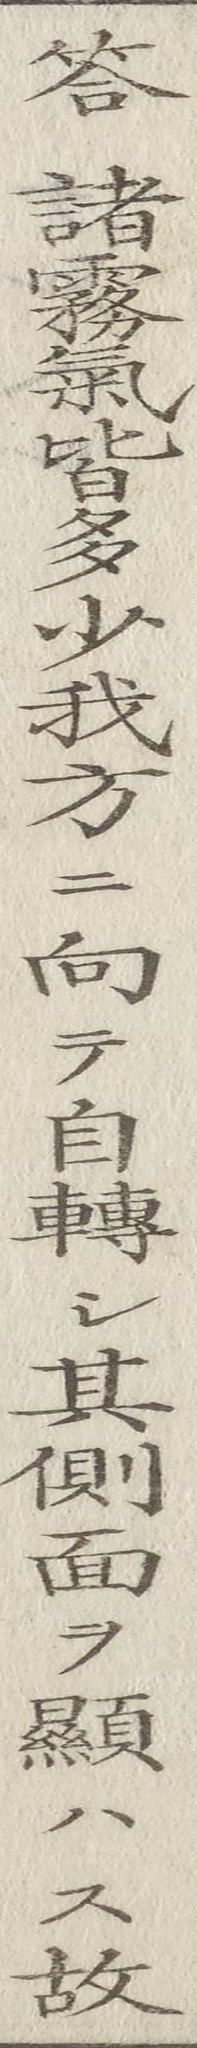答諸霧気皆多少我方ニ向テ自転シ其側面ヲ顕ハス故

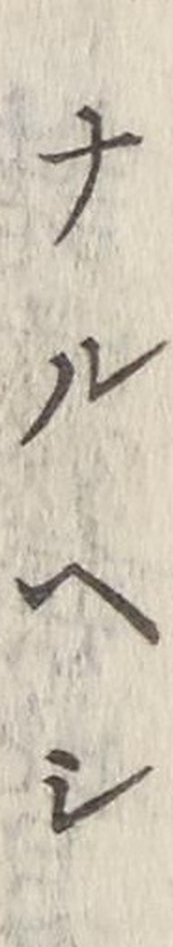ナルヘシ
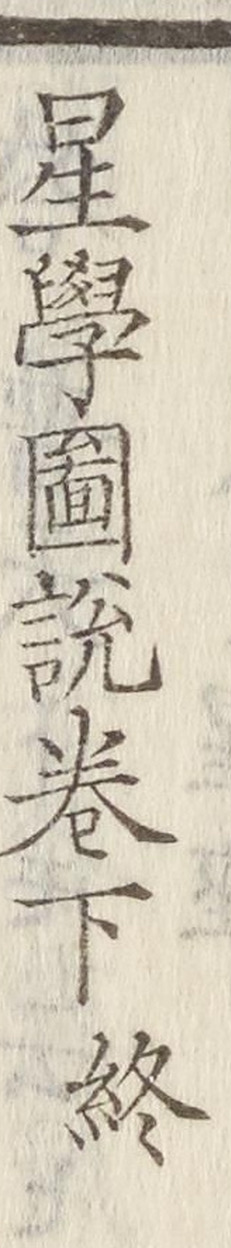星学図説巻下終
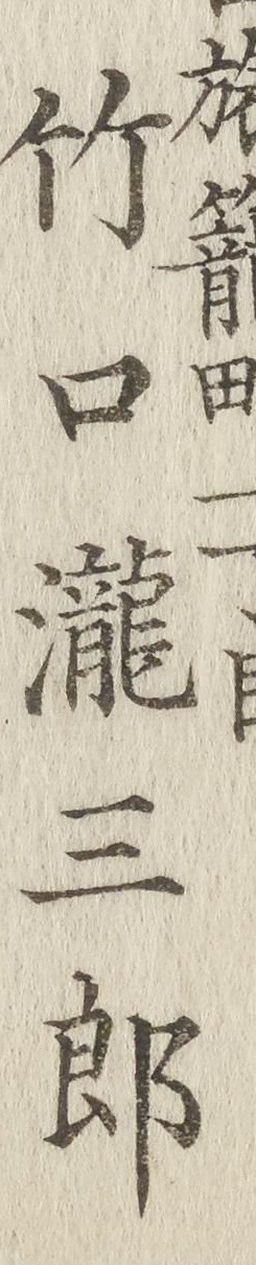竹口瀧三郎
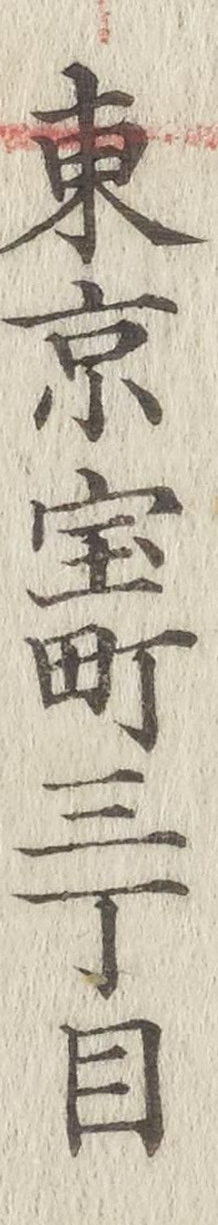東京宝町三丁目
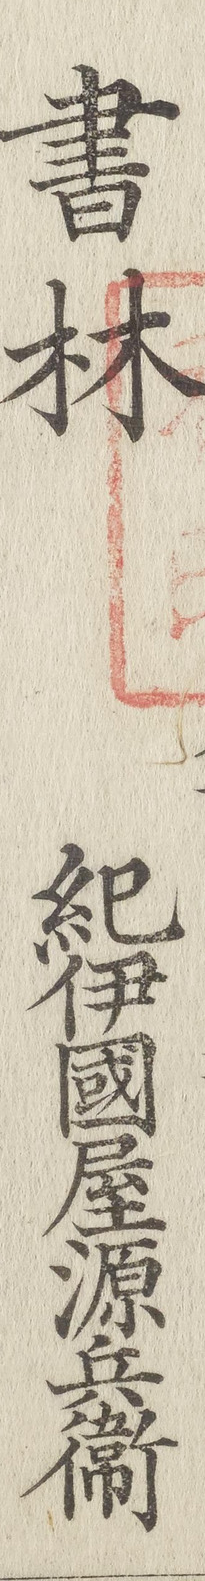書林紀伊国屋源兵衛
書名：星学圖説　下
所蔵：東京大学地震研究所図書室 Earthquake Research Institute Library, The University of Tokyo, JAPAN
